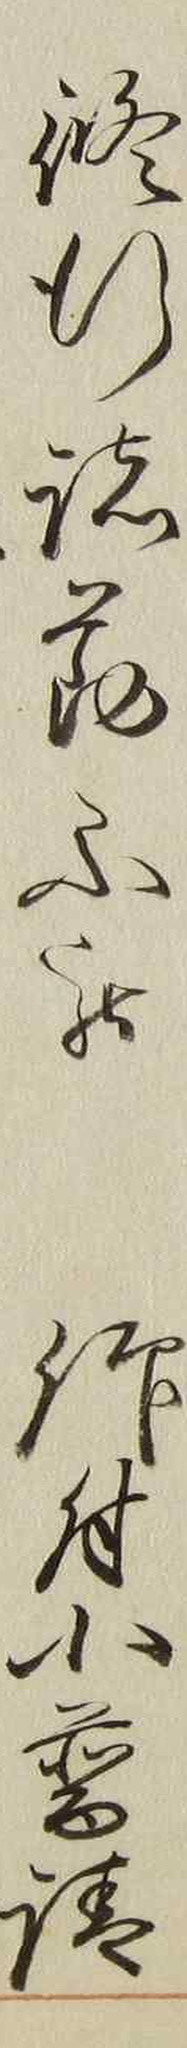修行諸勤不被仰付小普請
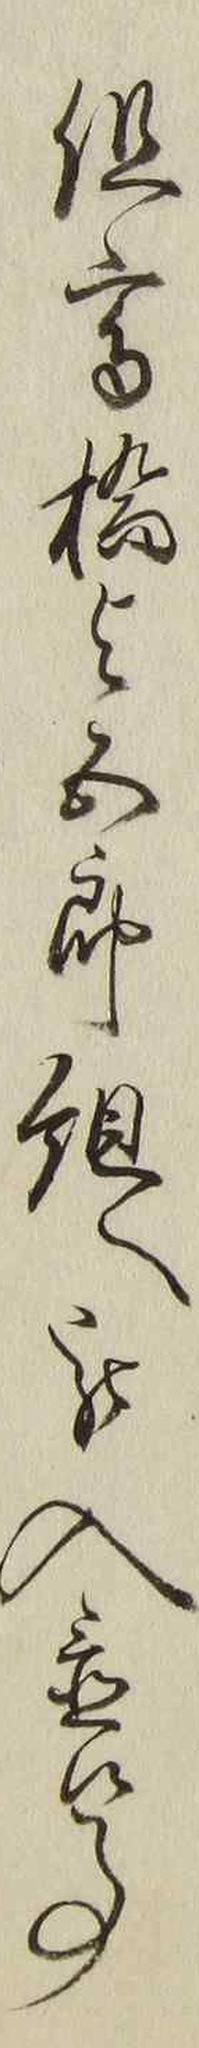但高橋与五郎組へ被入置候事
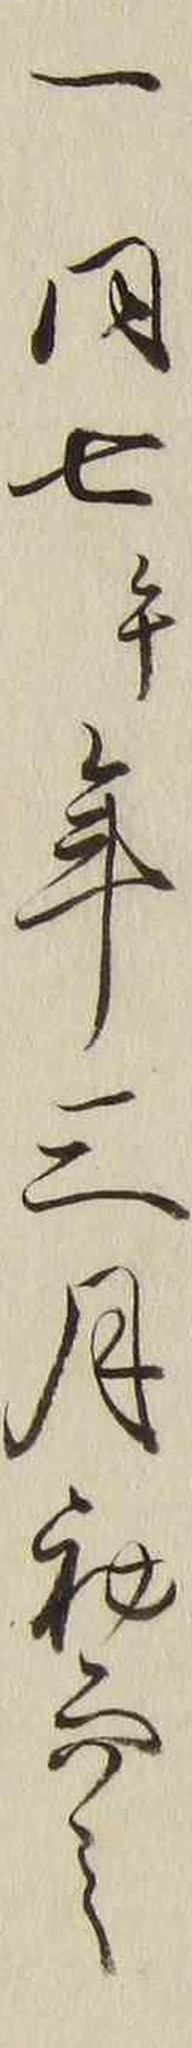一同七午年三月初而之

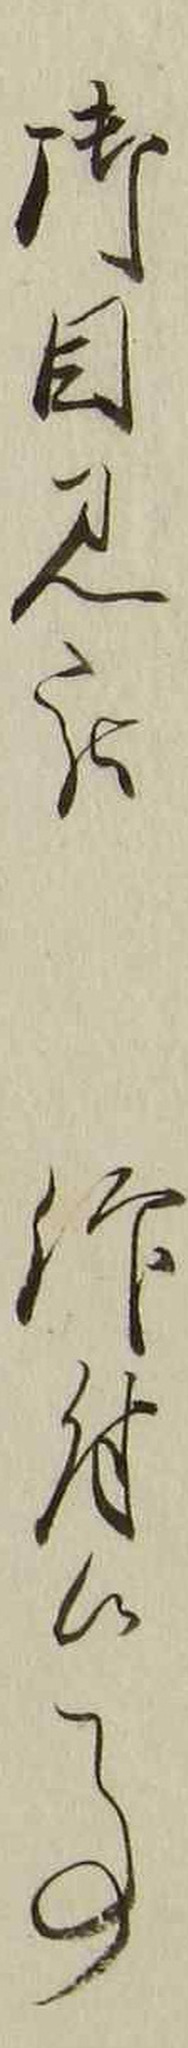御目見被仰付候事
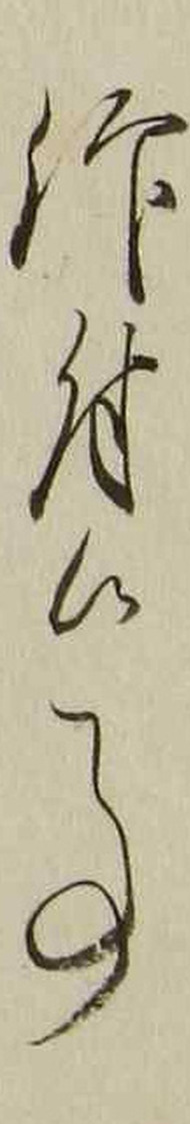仰付候事
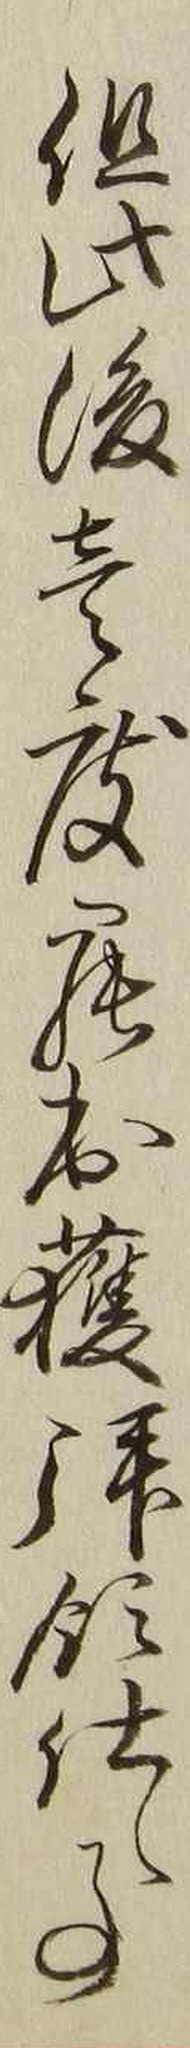但此後壱度ま罷出獲拝領仕候事
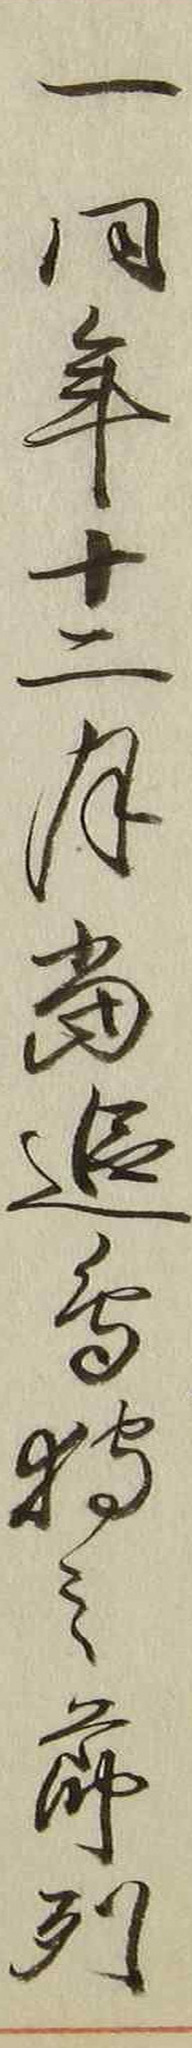一同年十二月当追鳥狩之節列
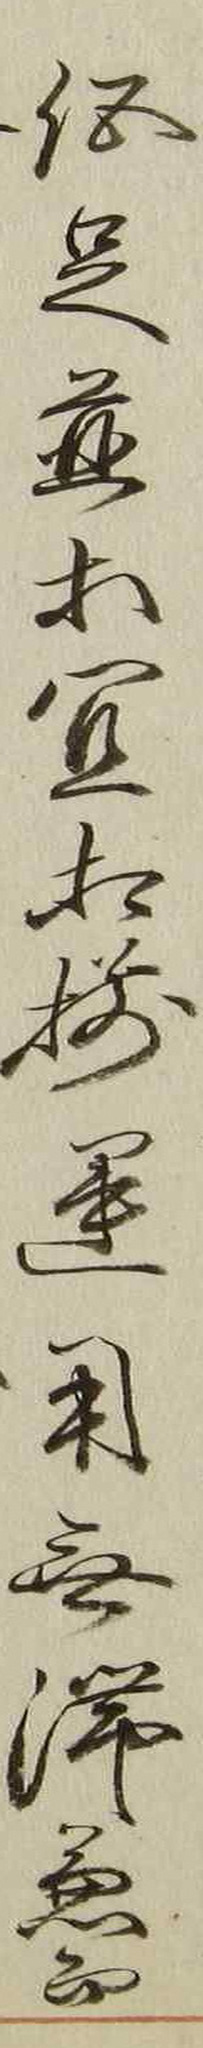伍足並相宜相揃運用無滞兼而
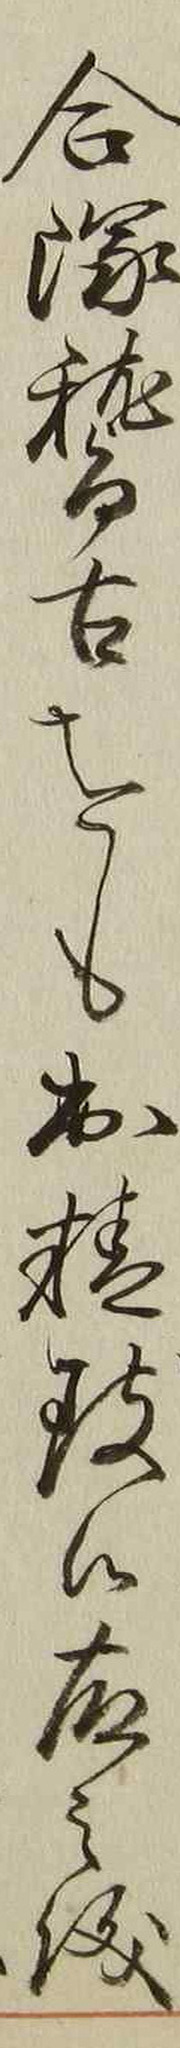合隊稽古をも出精致候故之儀
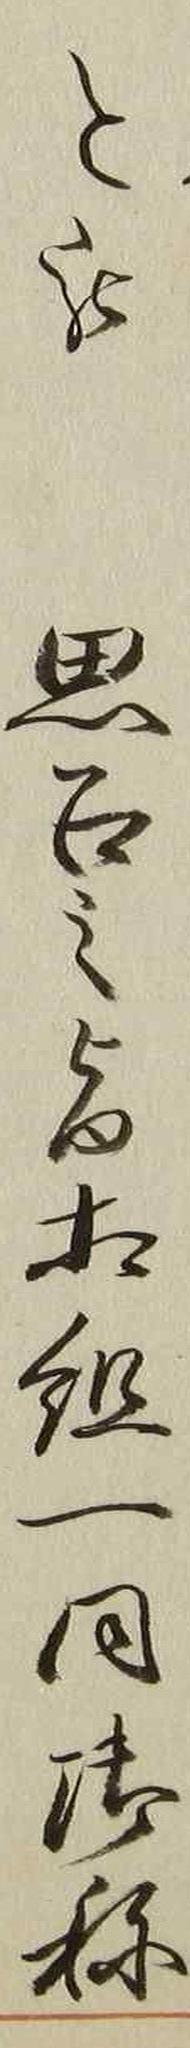と被思召之旨相組一同御称
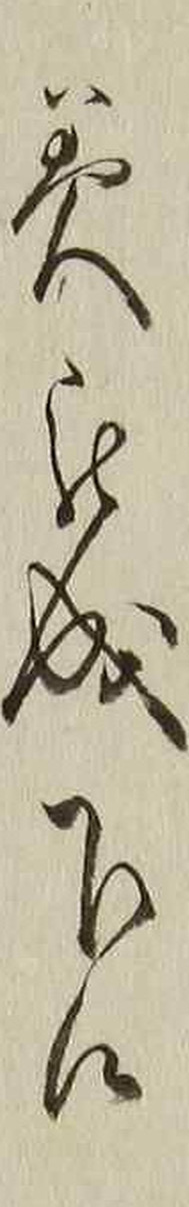美被成下候
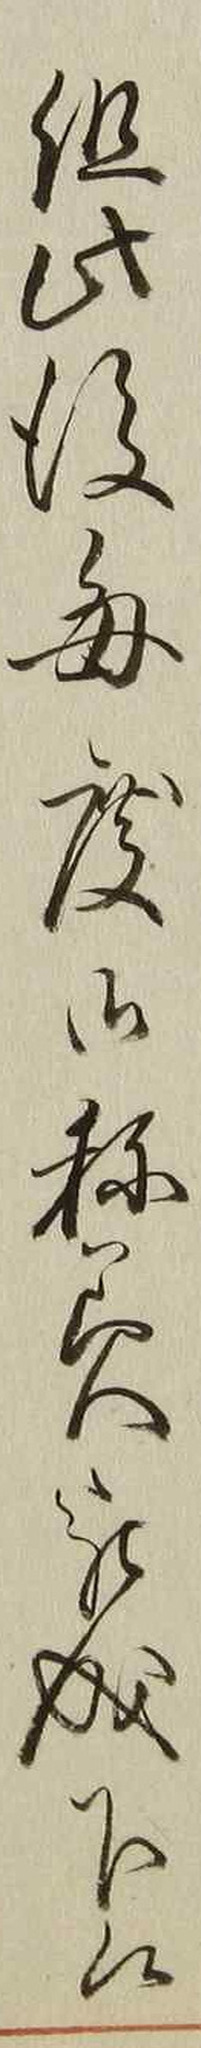但此後毎度御称美被成下候
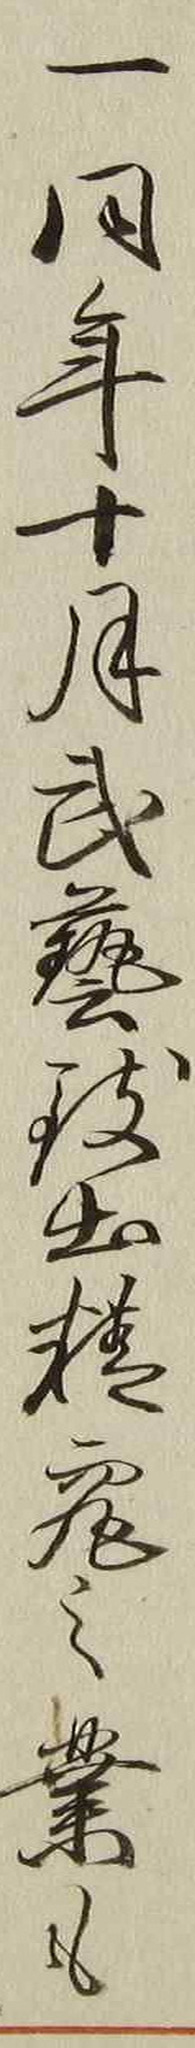一同年十月武芸致出精究之業も
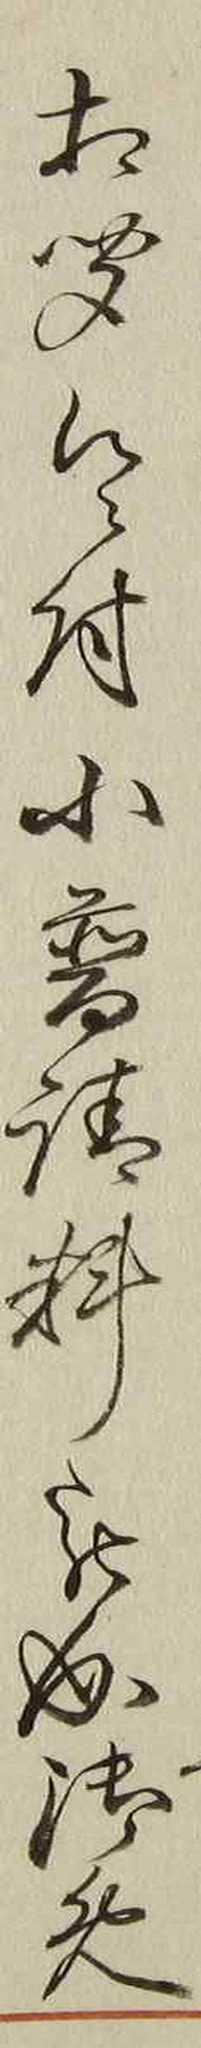相聞候ニ付小普請料被成御免
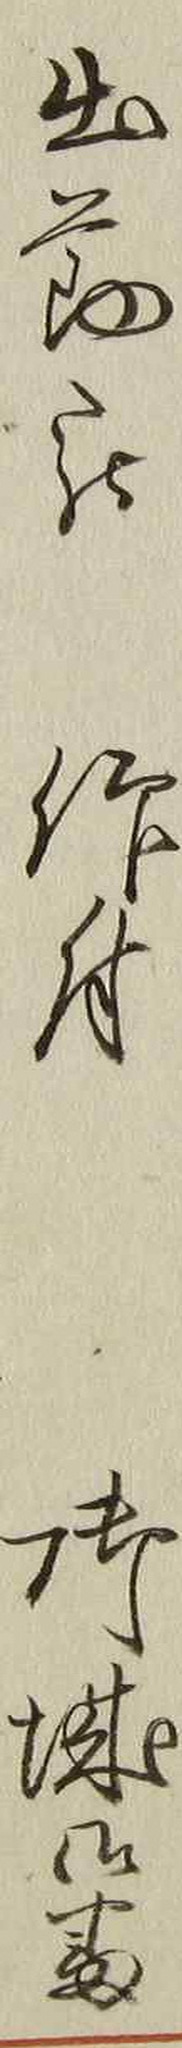出勤被仰付御城御番
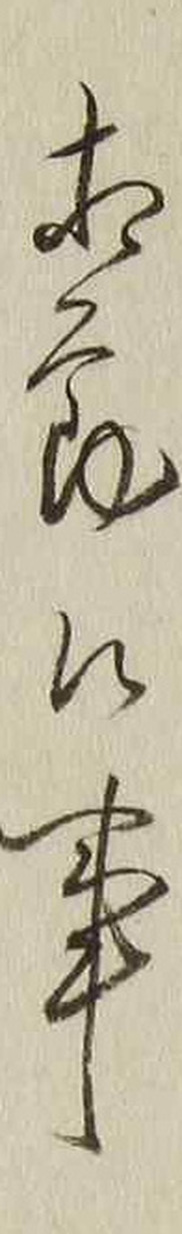相勤候事
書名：諸士系譜　巻之54　ほ之部1
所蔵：会津若松市立会津図書館
